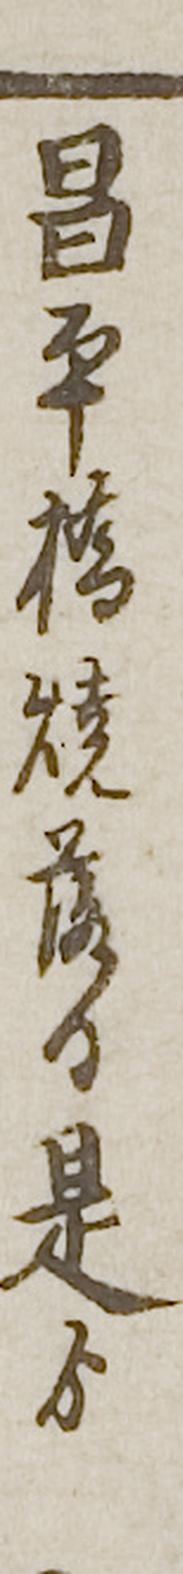昌平橋焼落る是ゟ
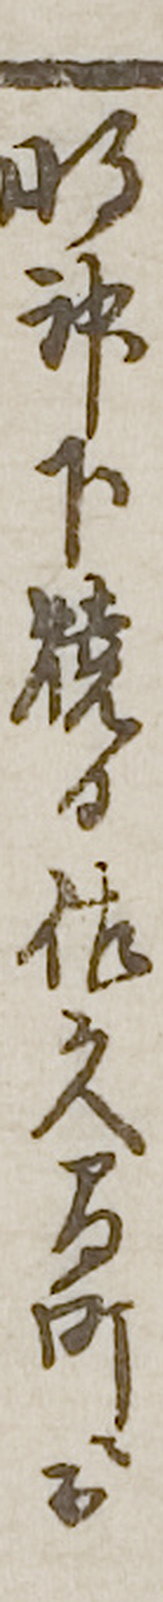明神下焼る佐久間町ニ而
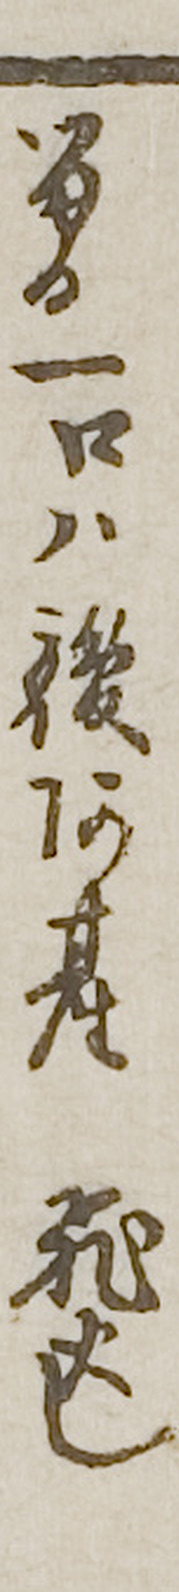留る一口は駿河台飛火し
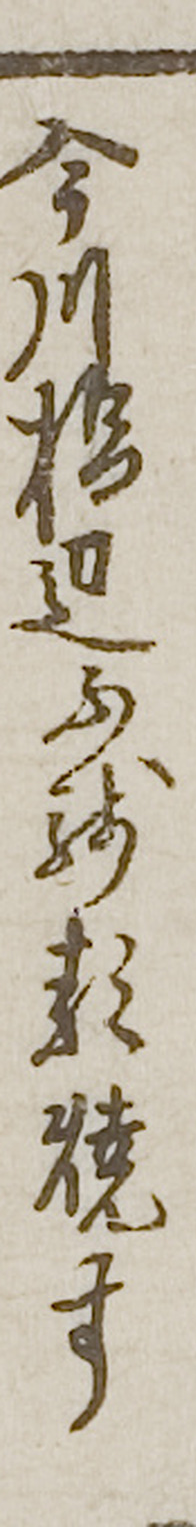今川橋辺不残類焼す
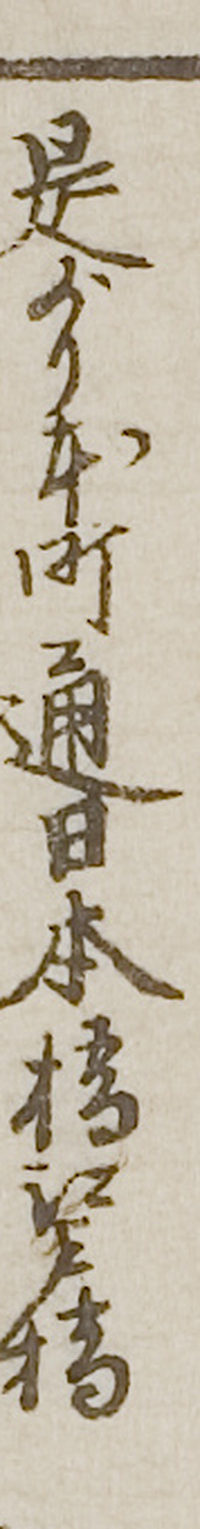是より本町通日本橋江戸橋
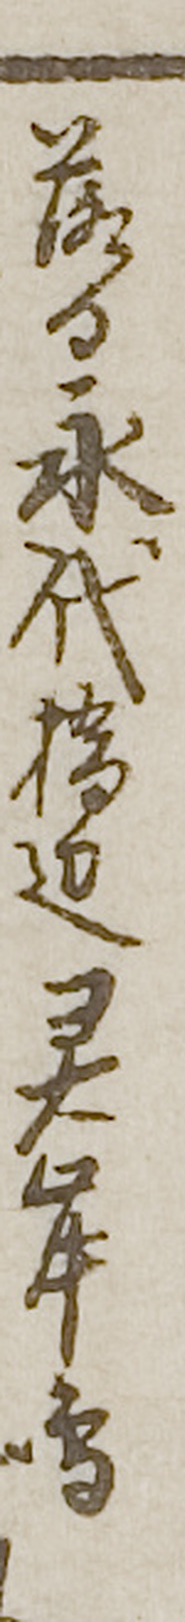落る永代橋辺霊岸島
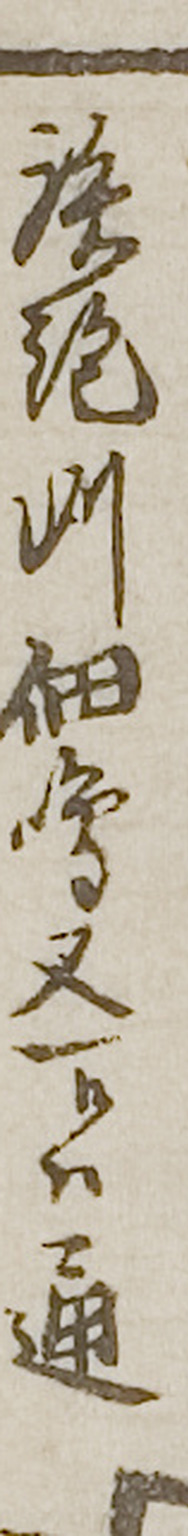鉄砲洲佃島又一口は通
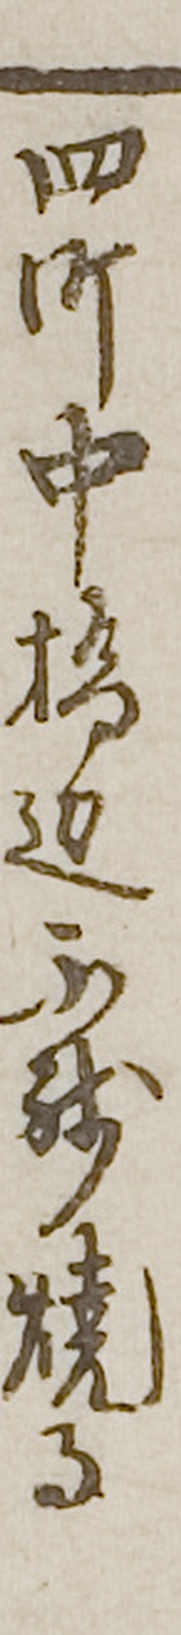四町中橋辺不残焼る
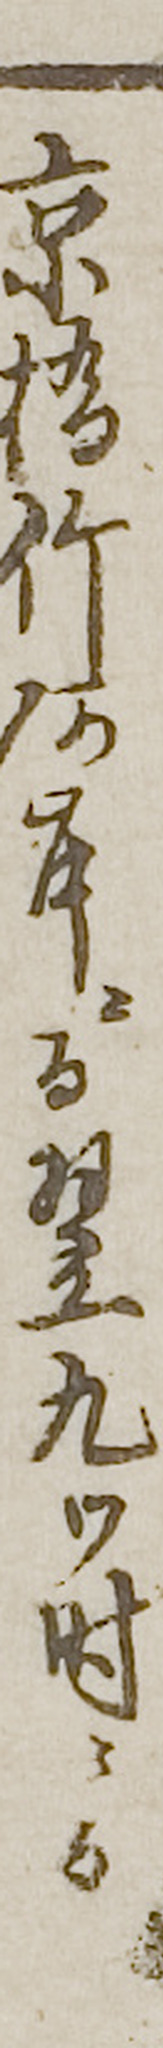京橋竹河岸ニ而翌九ツ時ニ而
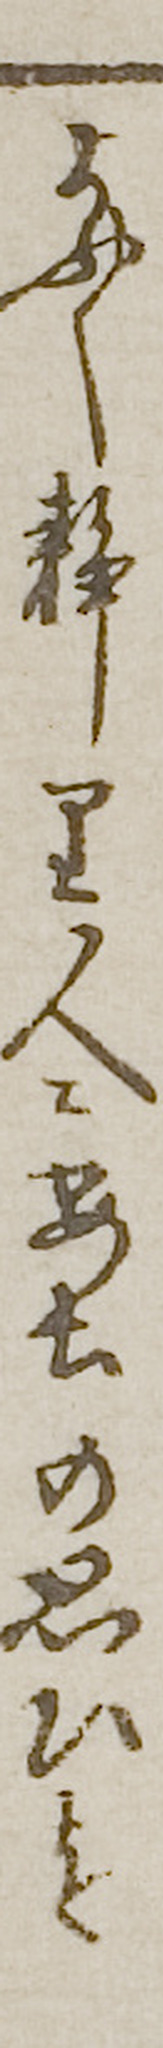よふ〳〵静り人々安土の思ひを
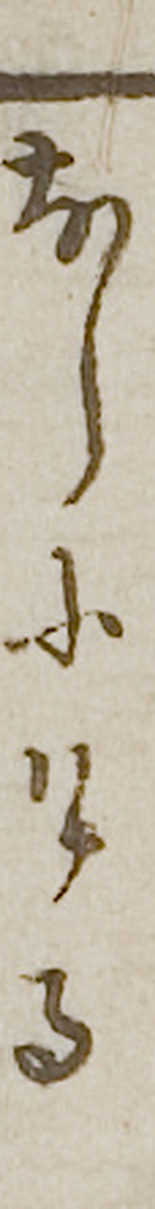なしにける
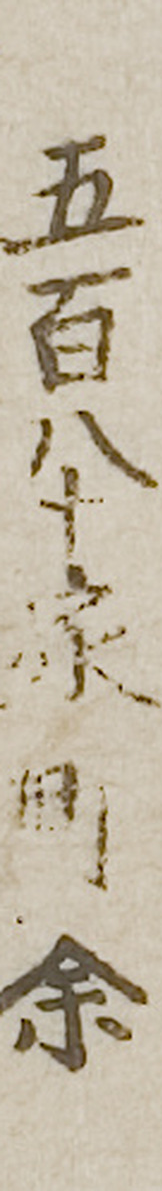町数五百八十家町余
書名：[弘化三丙午正月十五日大火類焼図]
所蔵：東京大学総合図書館 General Library in the University of Tokyo, JAPAN
